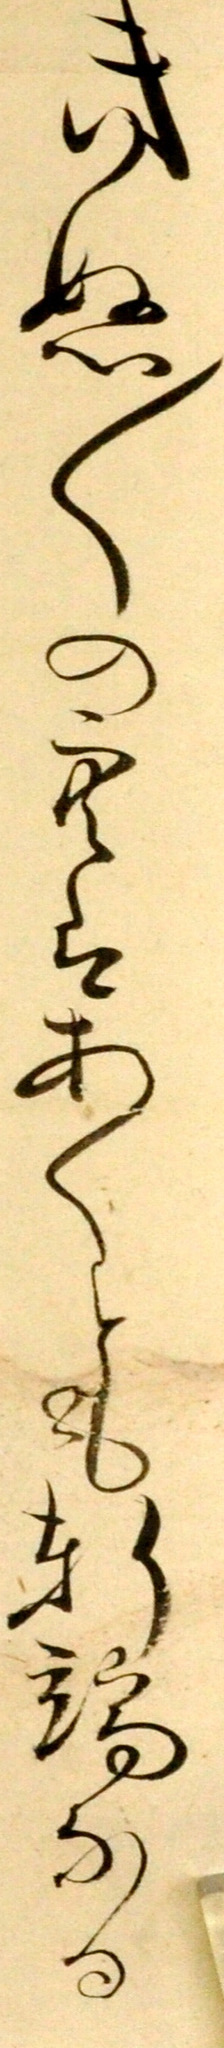きぬ〳〵の空はあくとも軒端なる
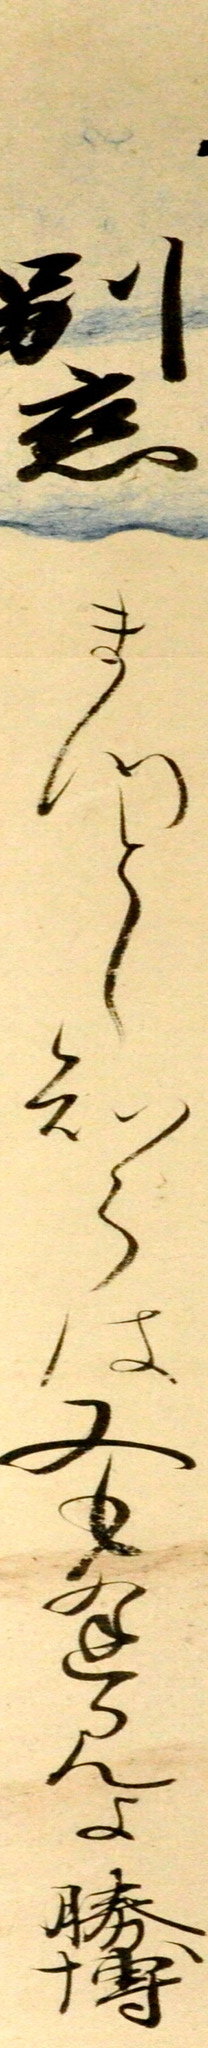まつとし知らは又も逢見よ勝博

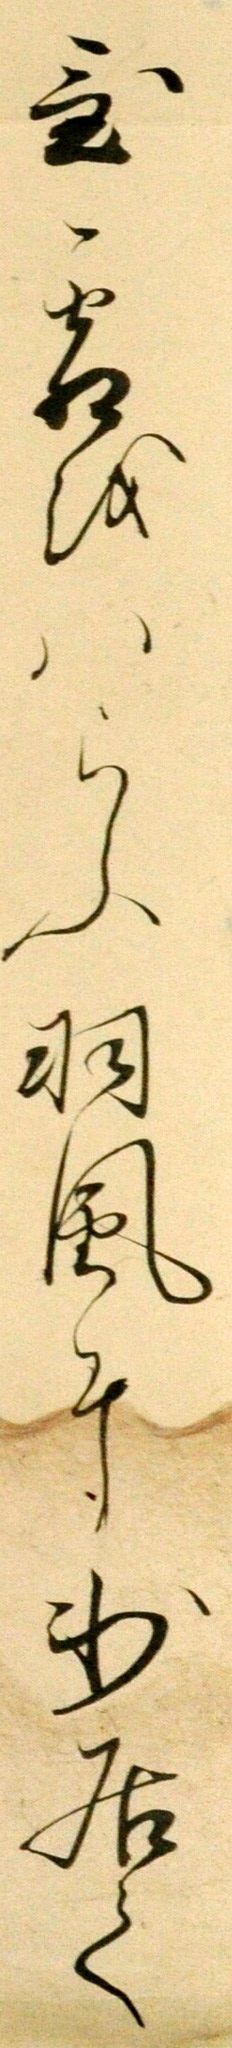置霜をはらふ羽風に氷居て
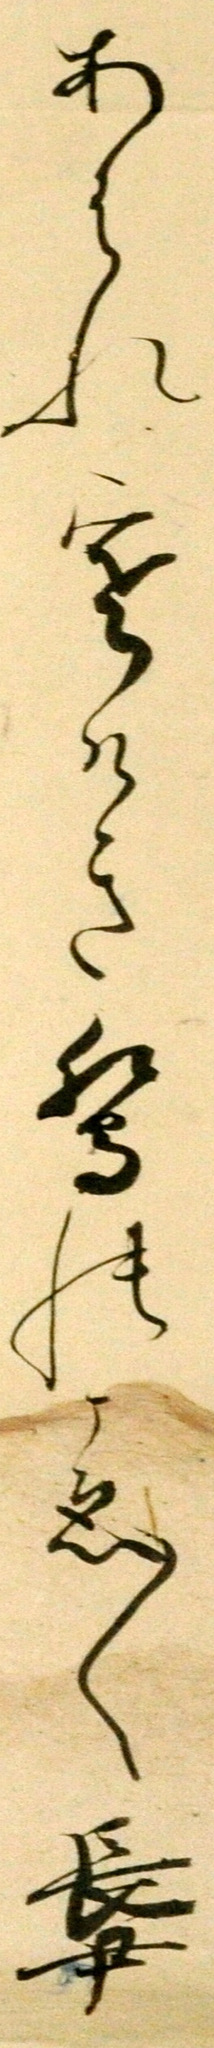あはれ寒けき鴛のこゑ〳〵長尹
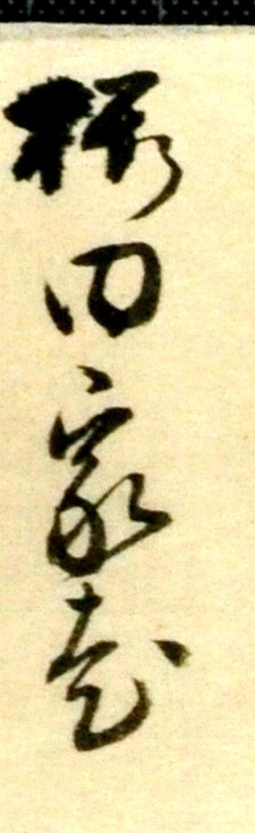桜田家老
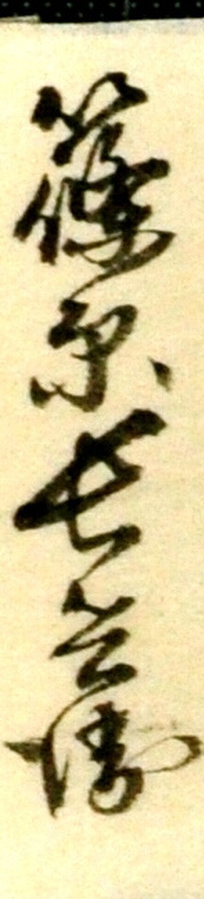篠原長兵衛

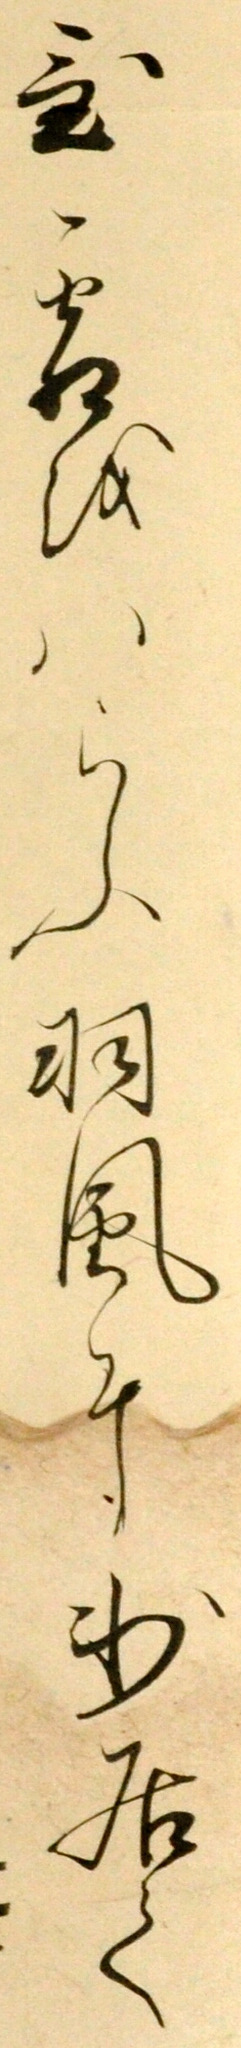置霜をはらふ羽風に氷居て
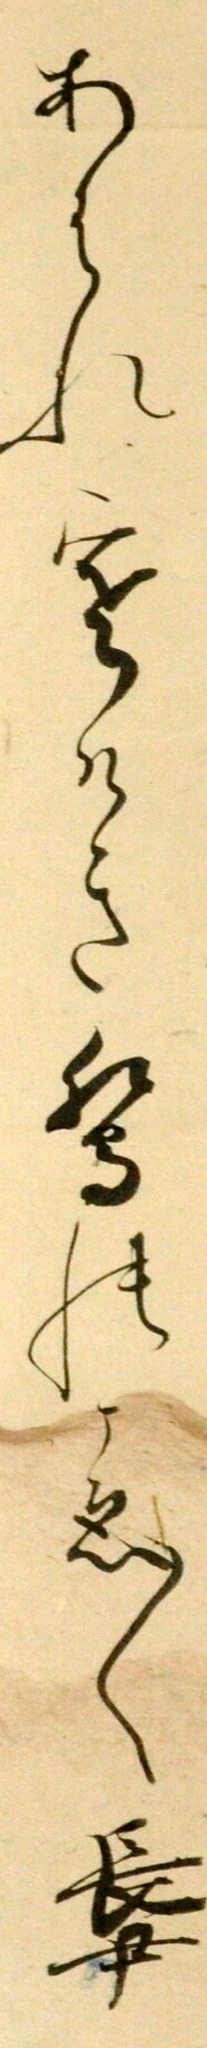あはれ寒けき鴛のこゑ〳〵長尹

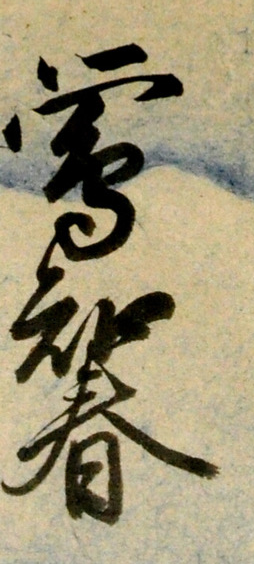鴬知春

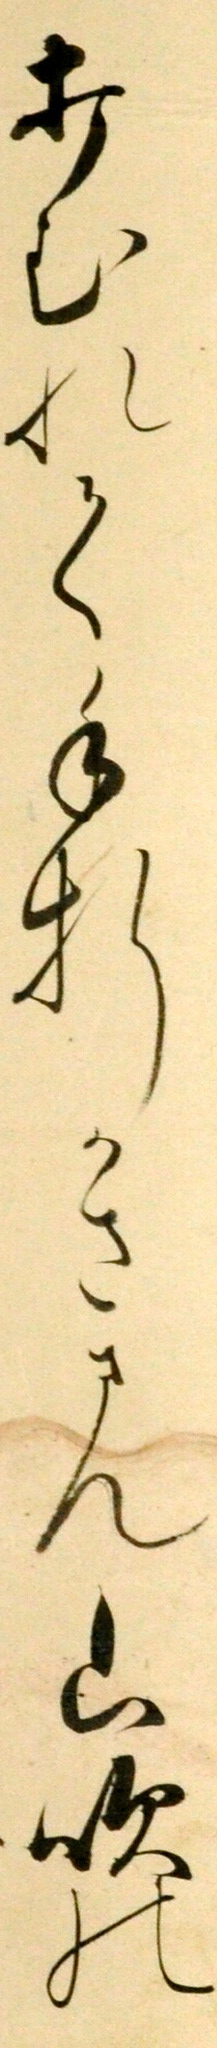打むれて手折かささん山吹の
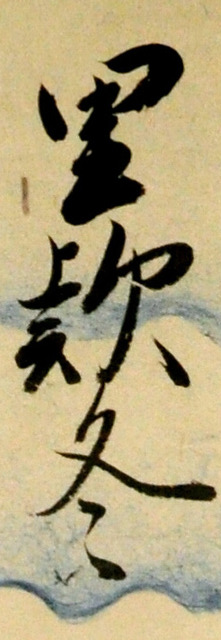里款冬
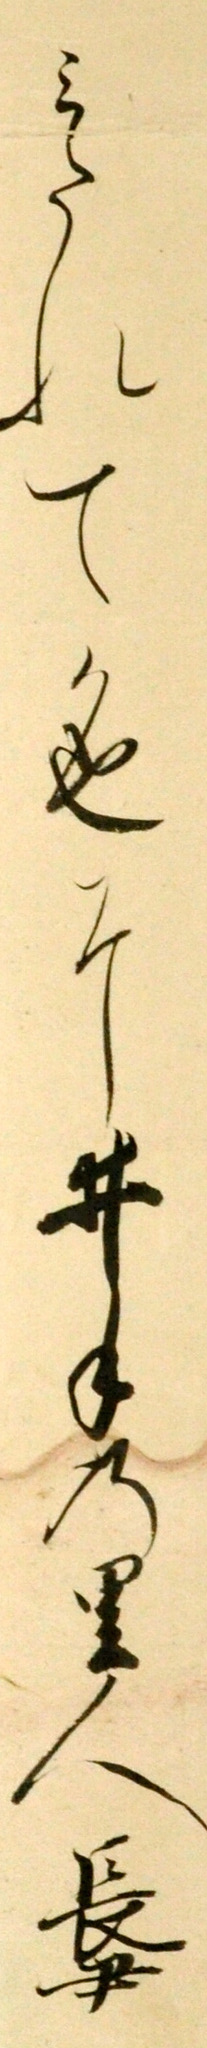みたれて色に井手の里人長尹

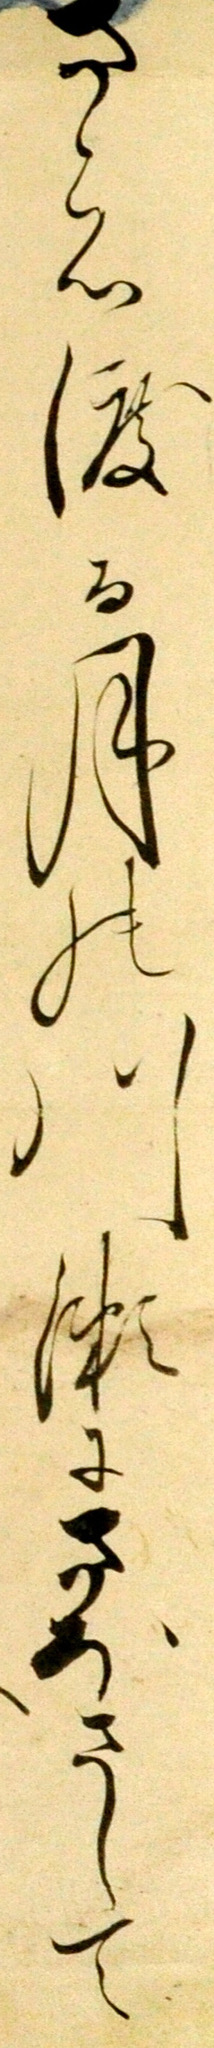さえ渡る月の川瀬にさほさして
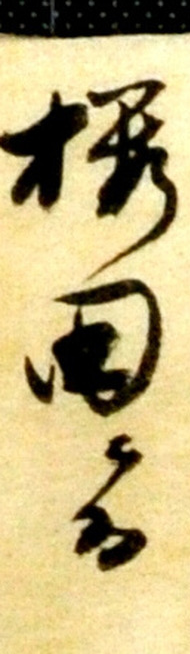桜田にて
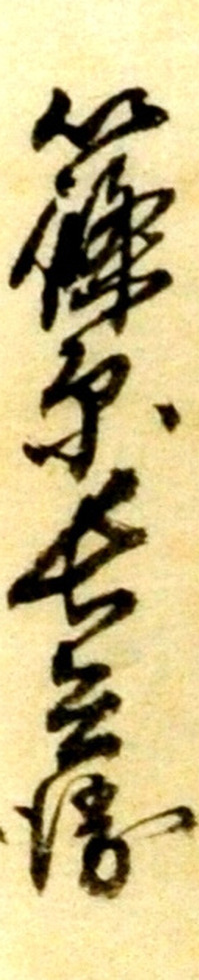篠原長兵衛

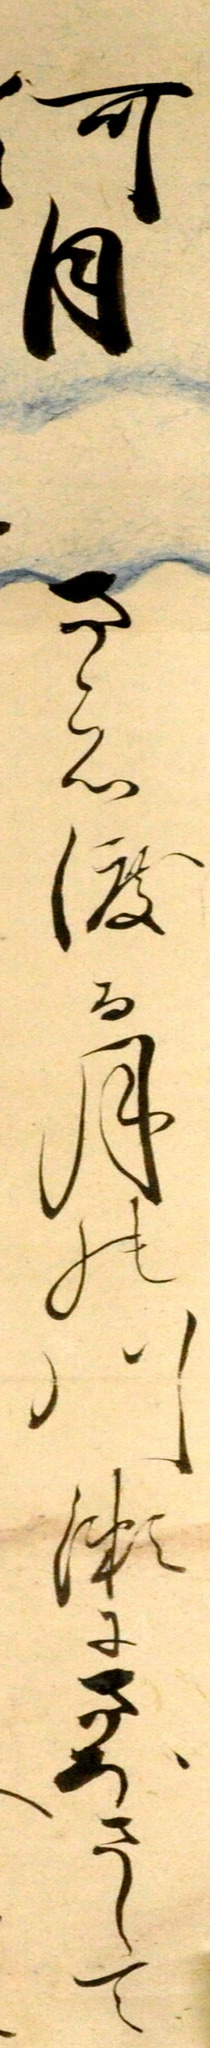さえ渡る月の川瀬にさほさして
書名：短冊
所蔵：伊那市立高遠町図書館・合同会社AMANE
